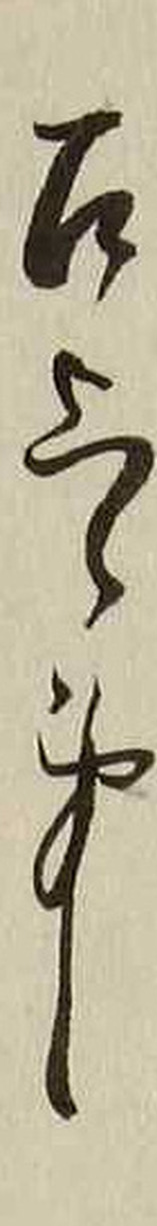召上候事
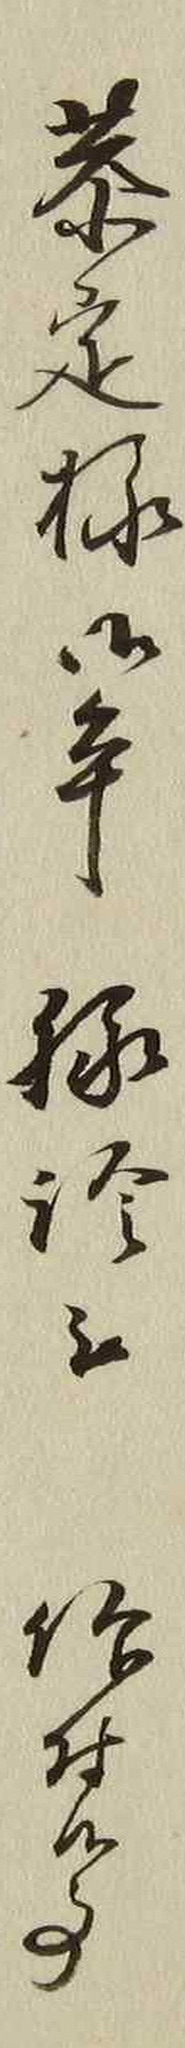恭定様御平脈診被仰付候事
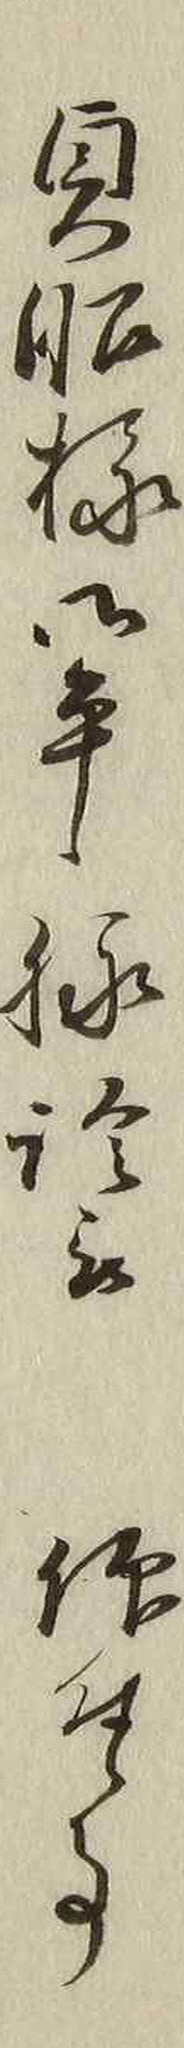貞昭様御平脈診被仰付候事
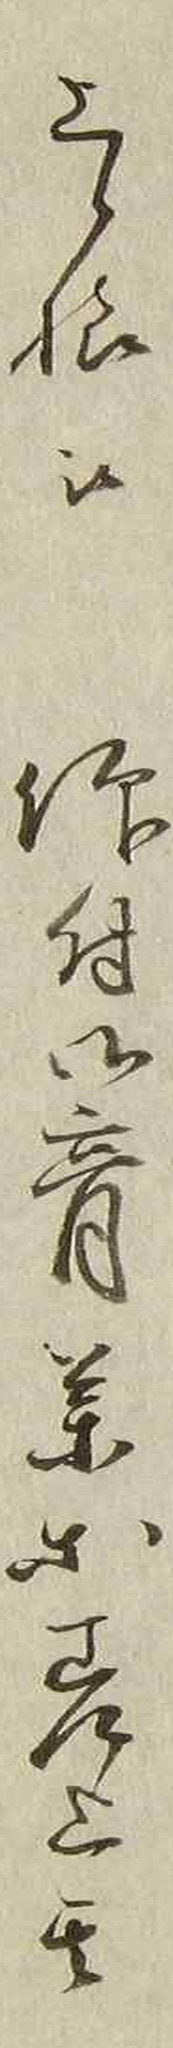上候様被仰付御膏薬等差上其
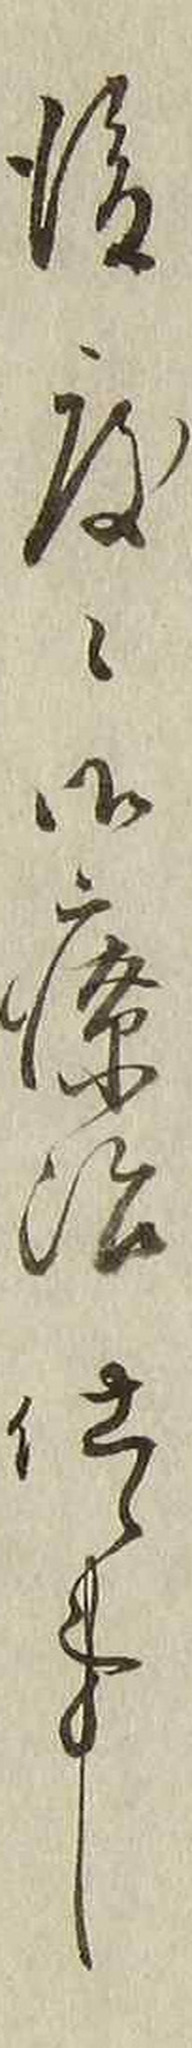後度々御療治仕候事
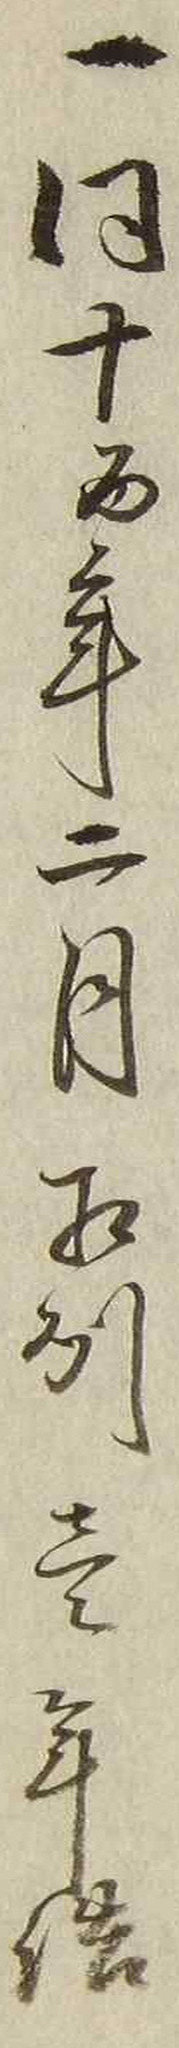一同十酉年二月相州壱年詰
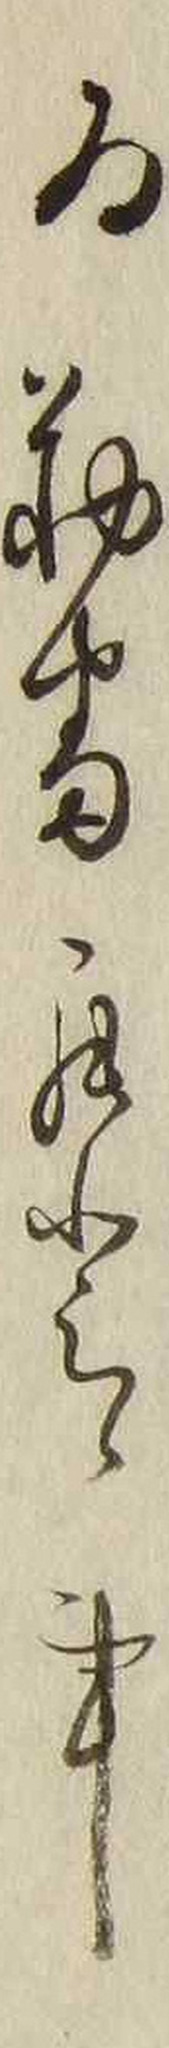為勤番罷登候事

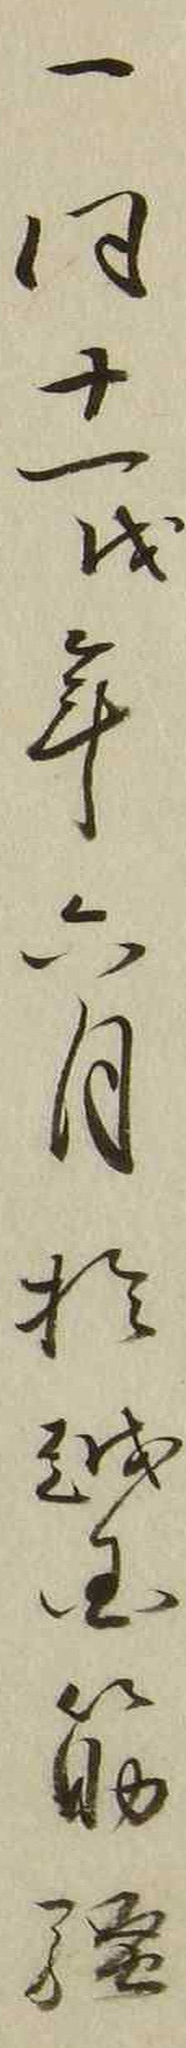一同十一戌年六月於越国筋騒
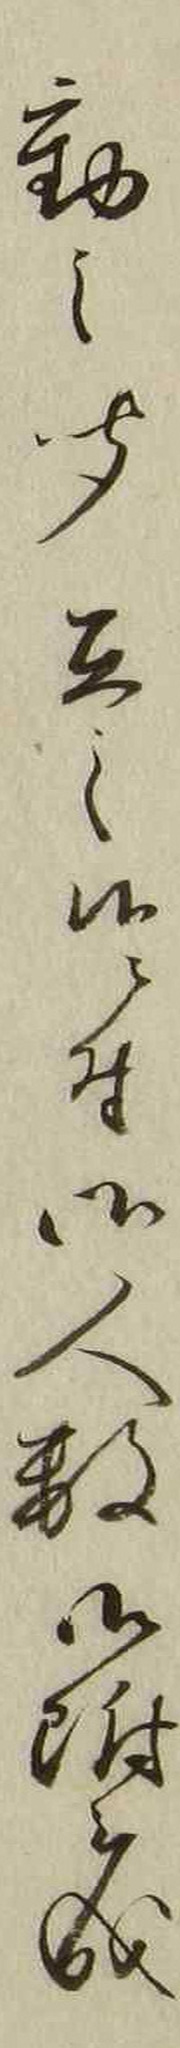動之聞在之候ニ付御人数御附被成
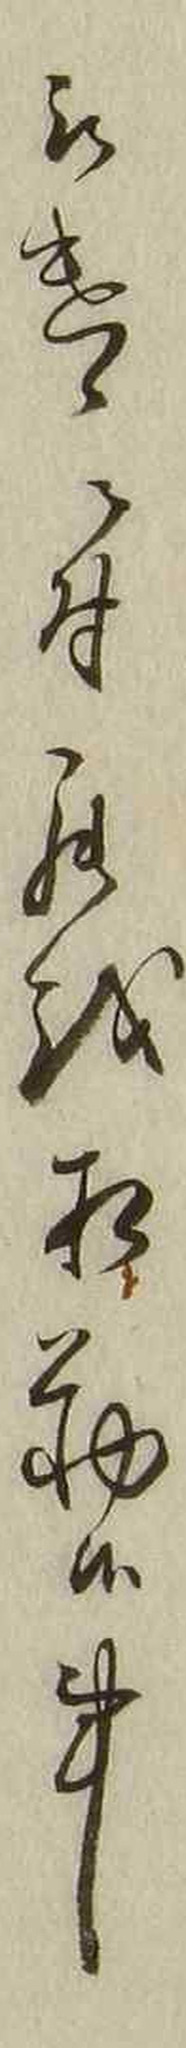被遣候ニ付罷越相勤候事
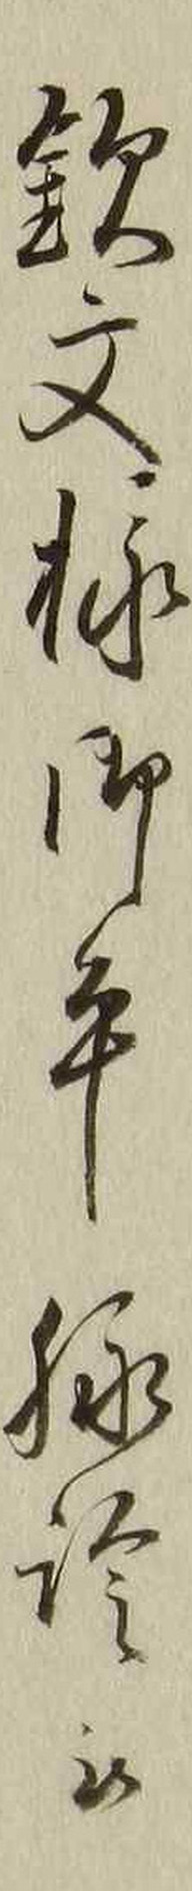欽文様御平脈診被
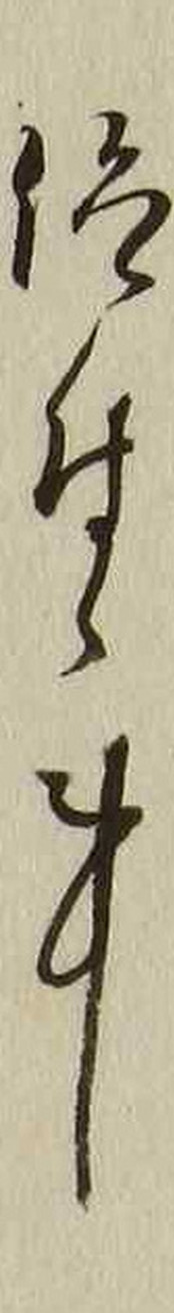仰付候事
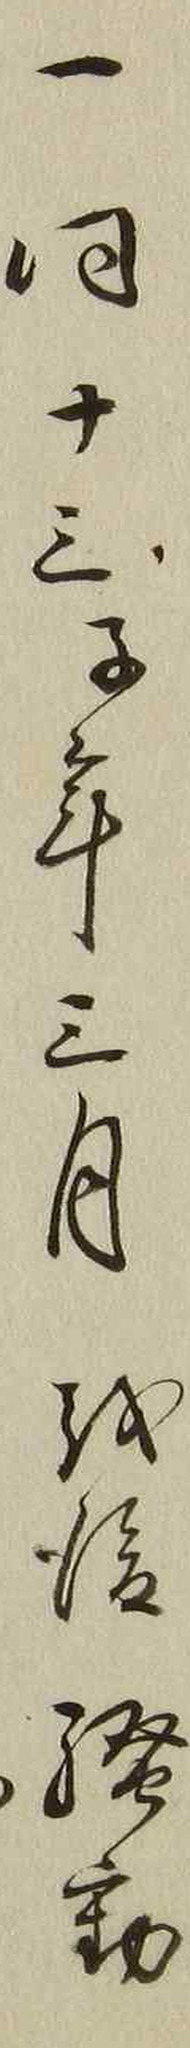一同十三子年三月越後騒動
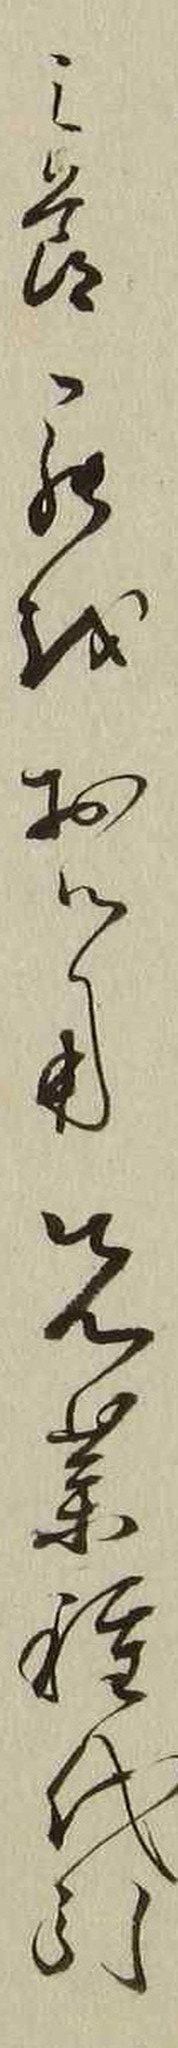之節罷越於御用先薬種代引
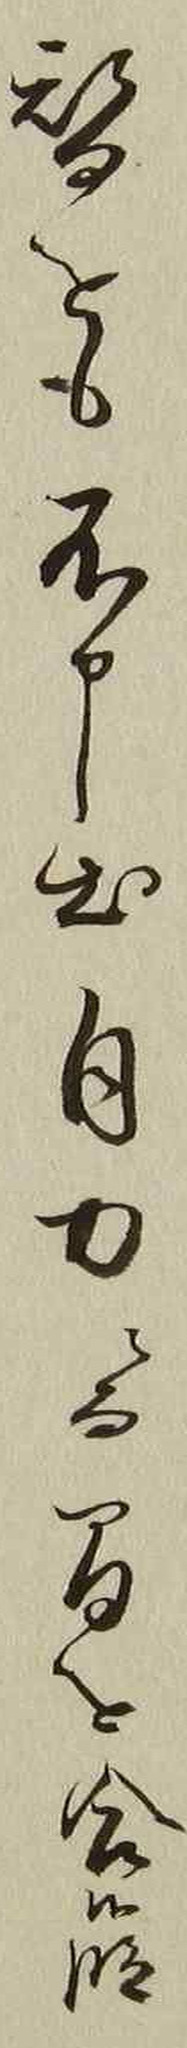替をも不申出自力ニ而間を合候段
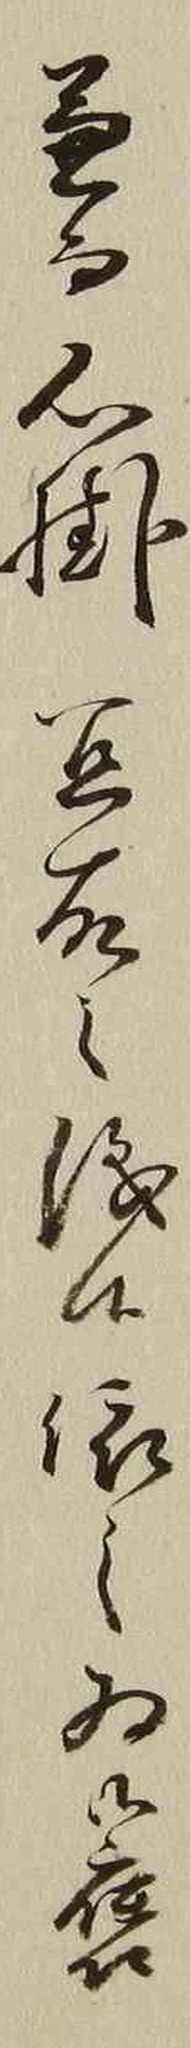兼而心掛宜故之儀候依之為御褒
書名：諸士系譜　巻之52　に之部3
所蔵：会津若松市立会津図書館
